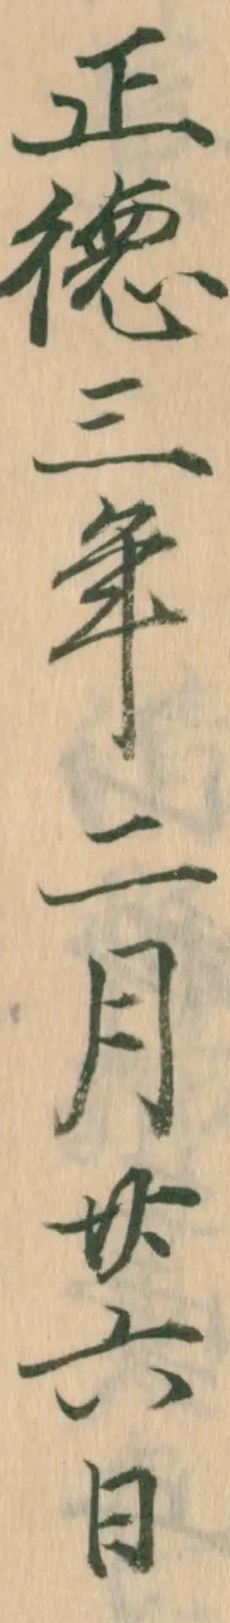正德三年二月廿六日
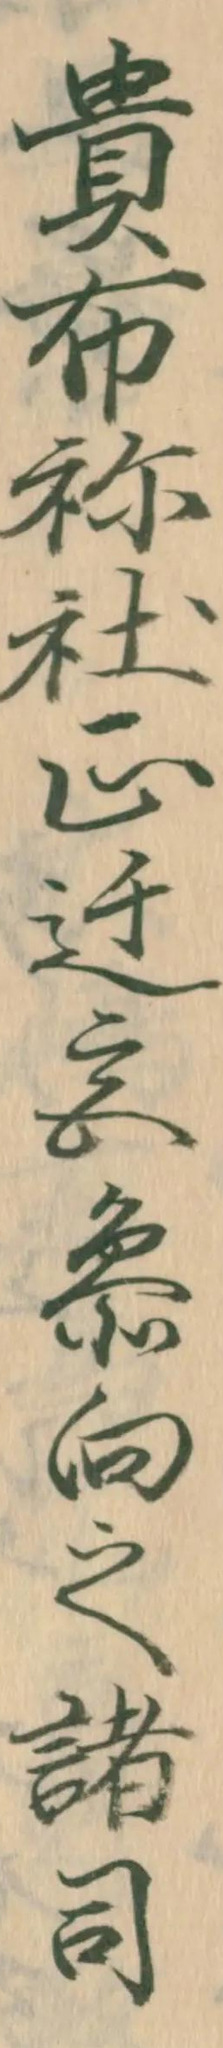貴布祢社正迁宮参向之諸司
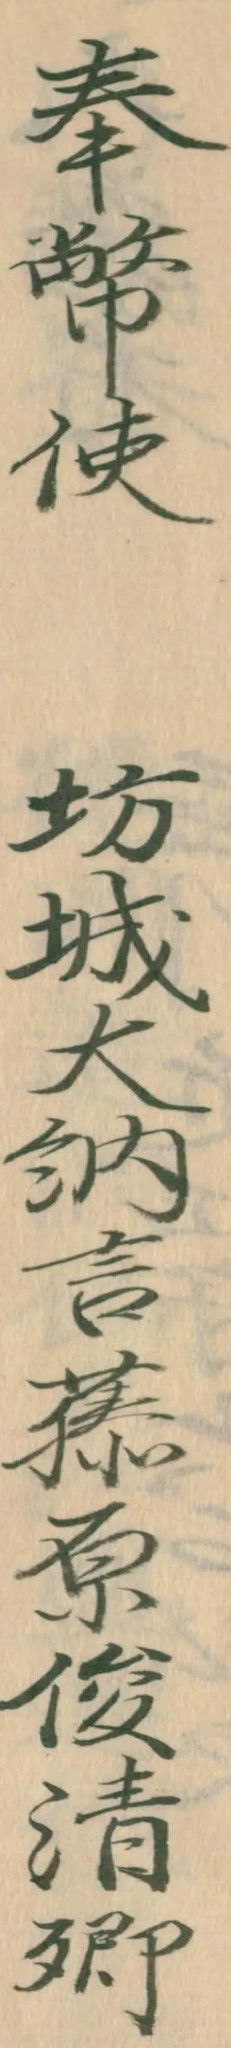奉幣使坊城大納言藤原俊清卿
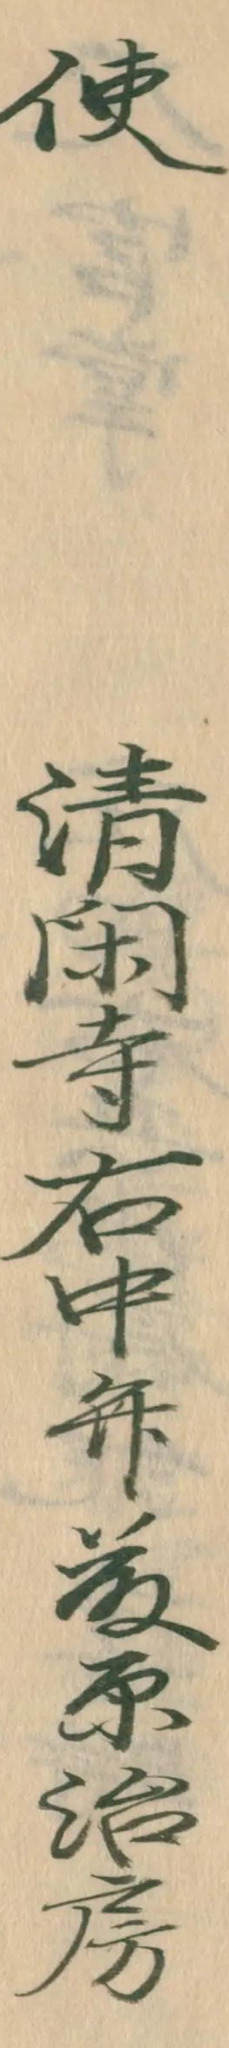使清閑寺右中弁藤原治房
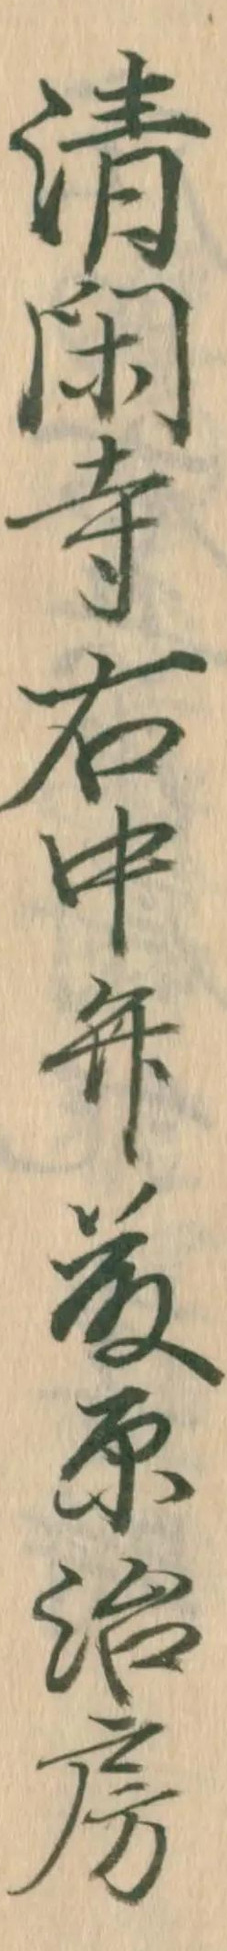使清閑寺右中弁藤原治房
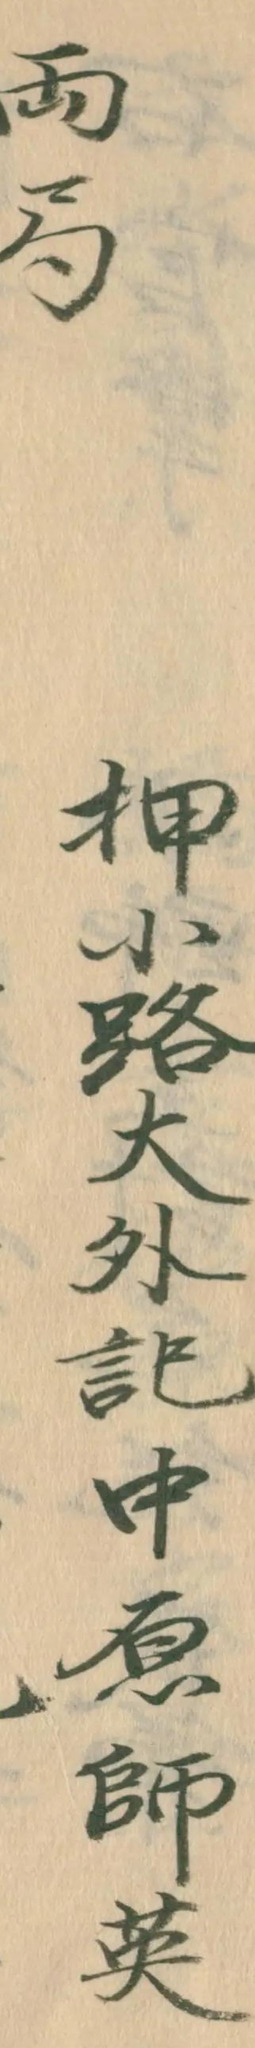両局押小路大外記中原師英
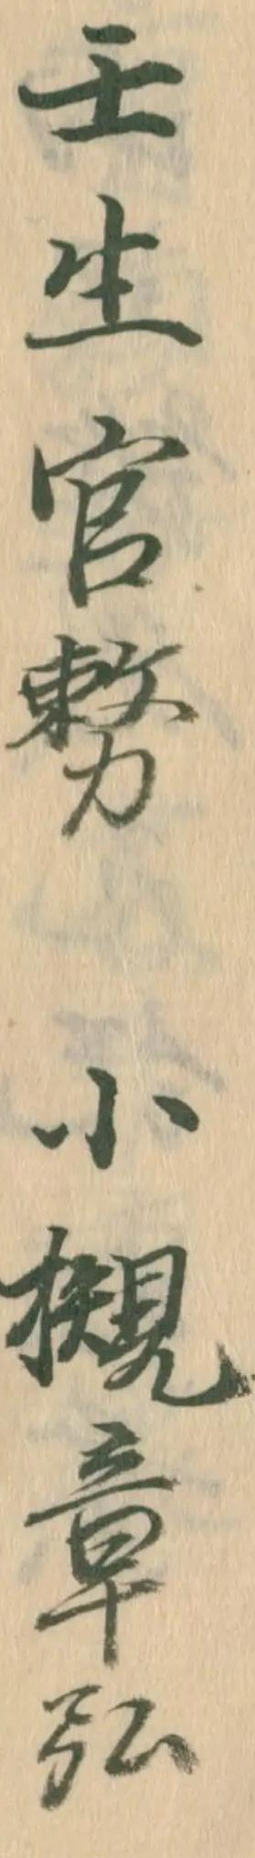壬生宮務小槻章弘
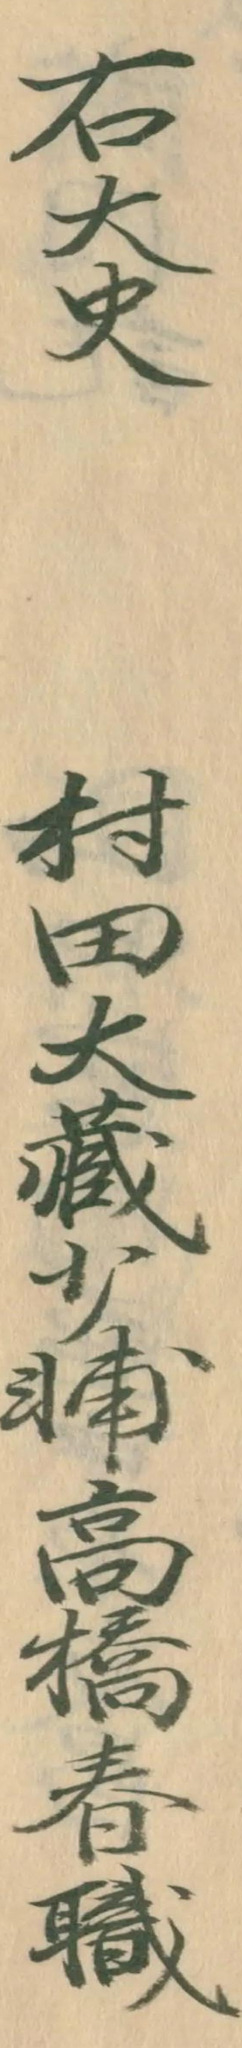右大史村田大蔵少輔高橋春職

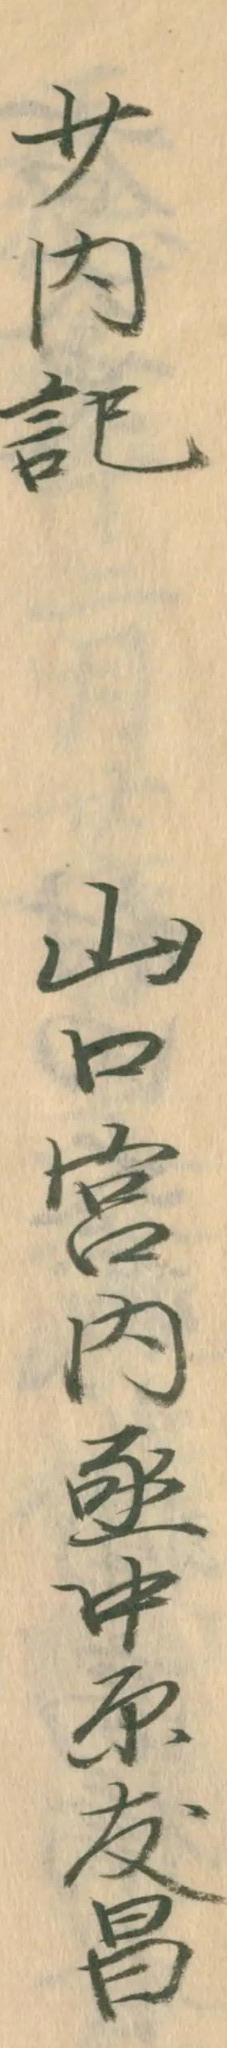少内記山口宮内丞中原友昌
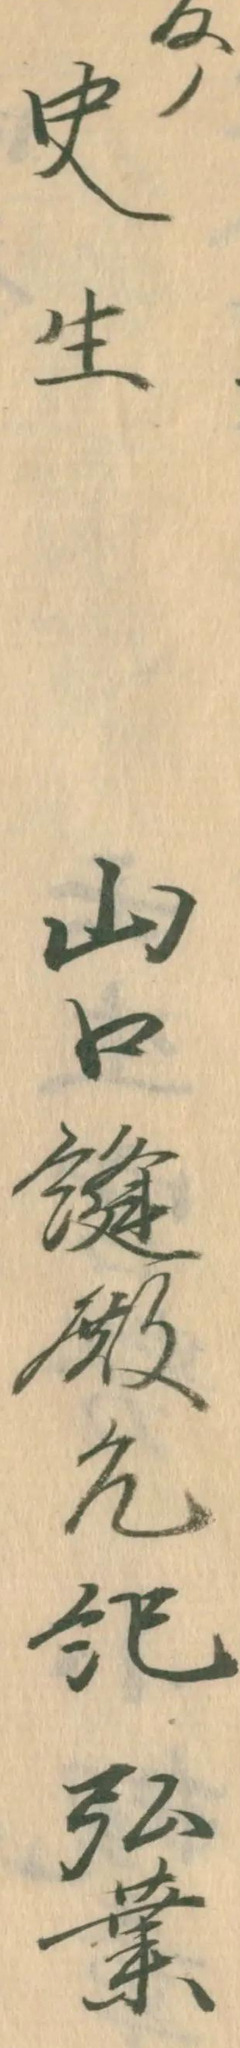史生山口縫殿允紀弘業
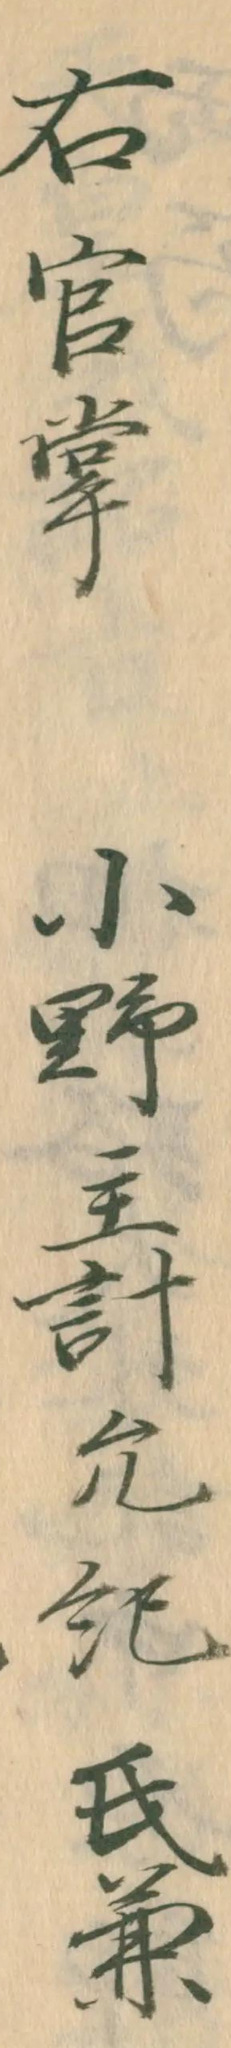右官掌小野主計允紀氏兼
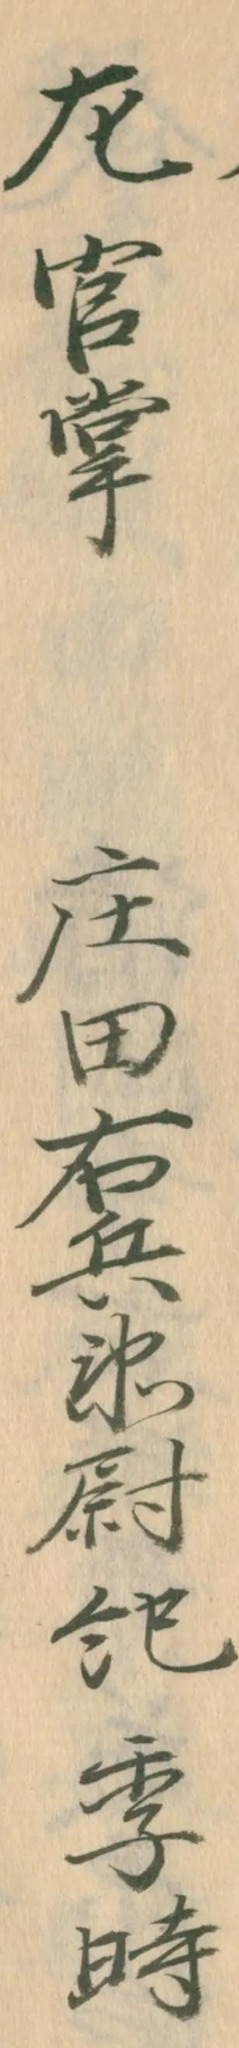左官掌庄田右兵衛尉紀季時
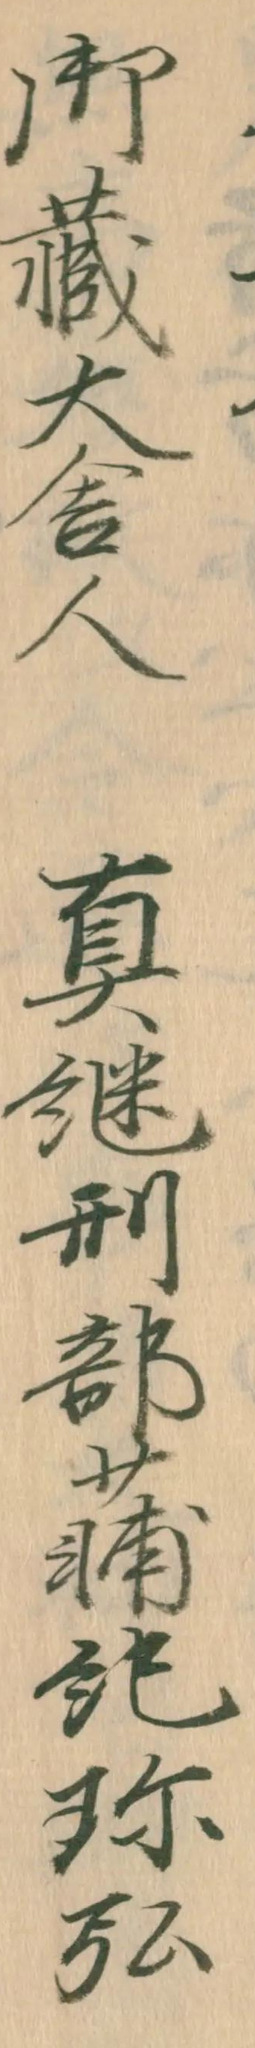御蔵大舎人真継刑部少輔紀珎弘
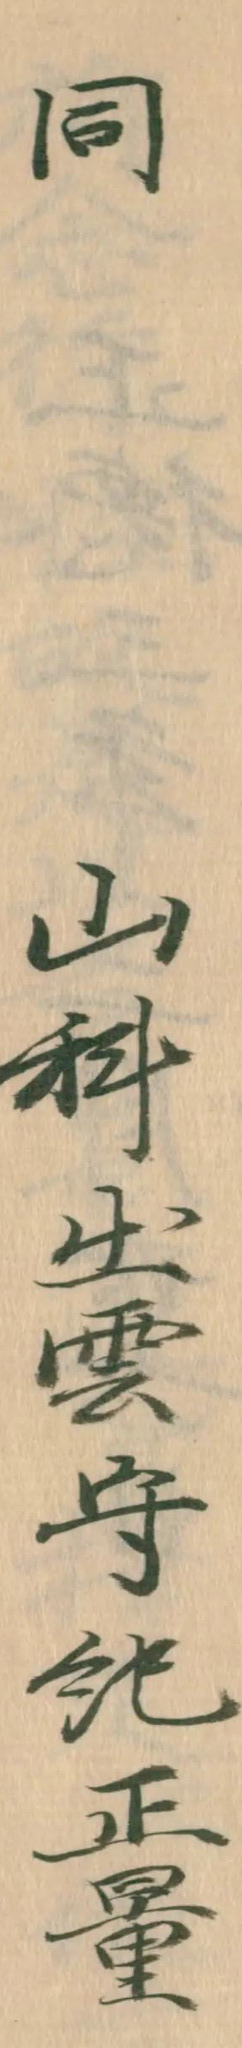同山科出雲守紀正量
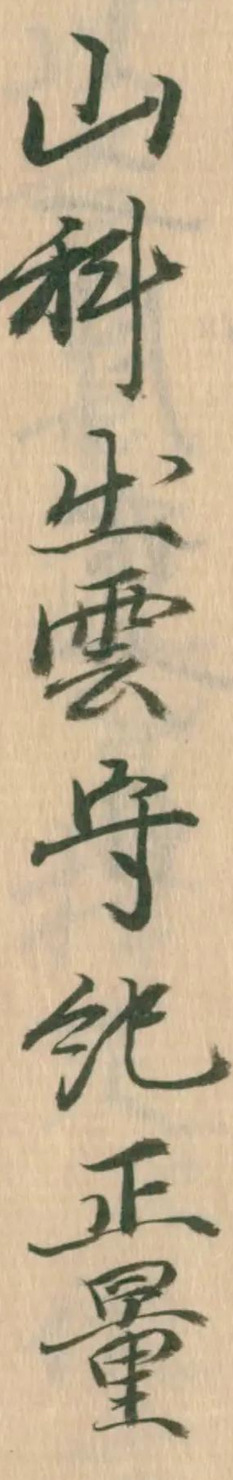同山科出雲守紀正量
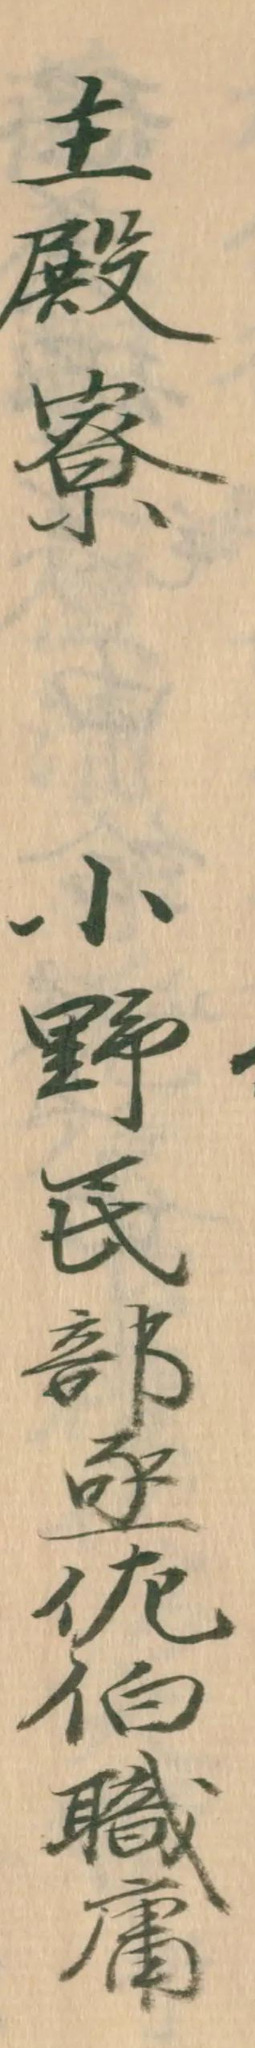主殿寮小野民部丞佐伯職庸
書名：賀茂社記録. 第16冊
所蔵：国立国会図書館 National Diet Library, JAPAN
